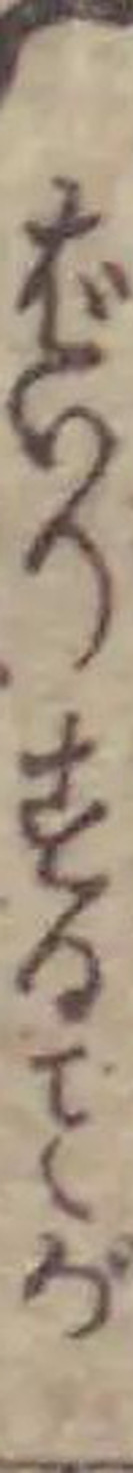ばいりすることが
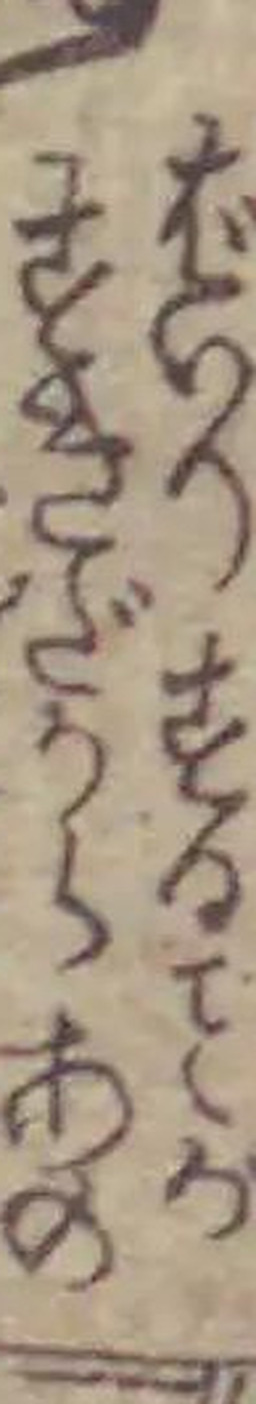すきだからあの
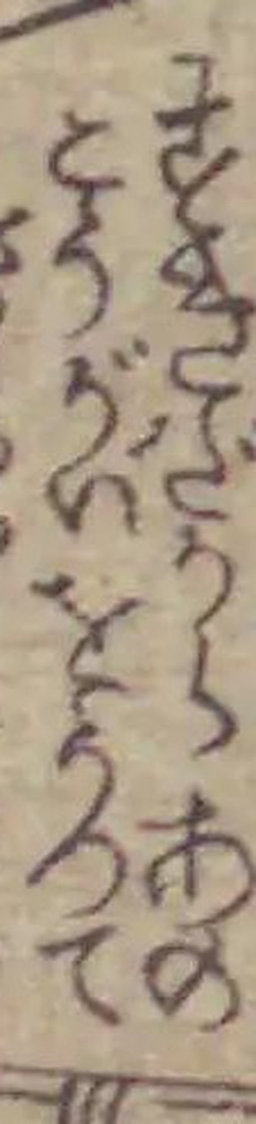こうがいをかつて
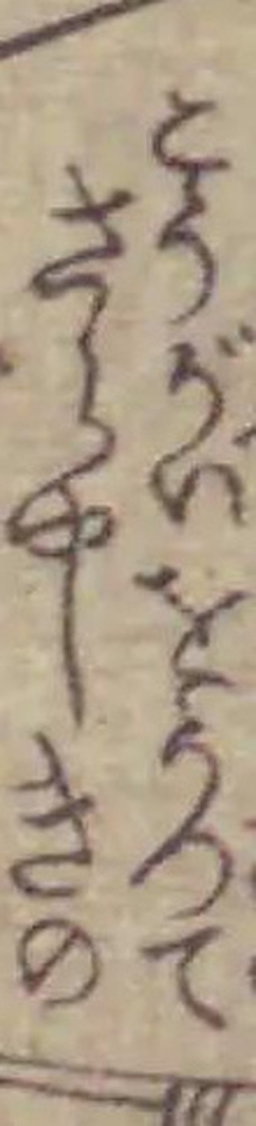さらやしきの
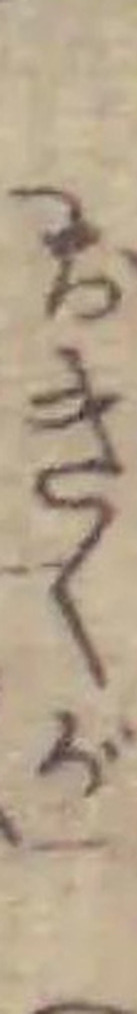おきくが
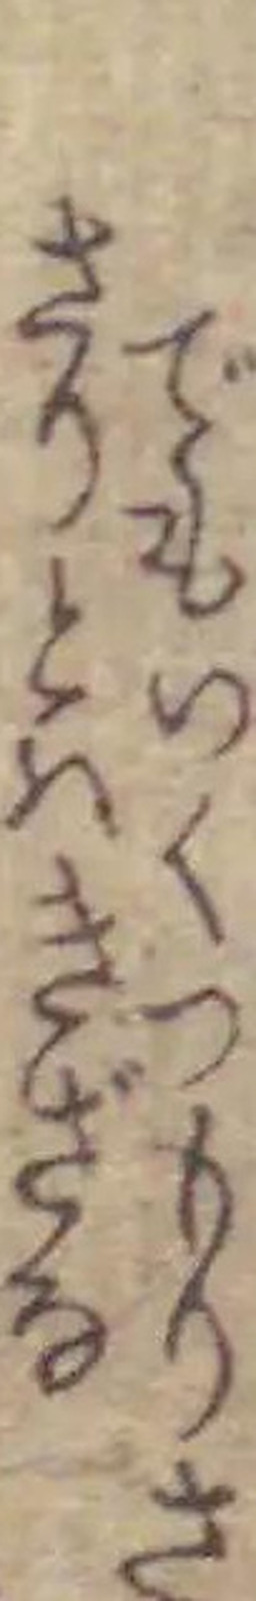さりとはきざな
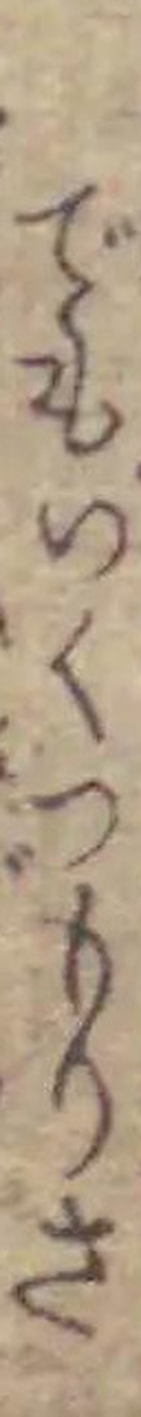でもいくつもりさ
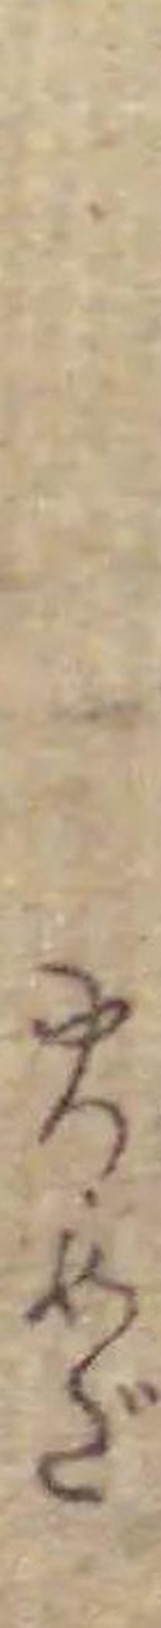やつめだ
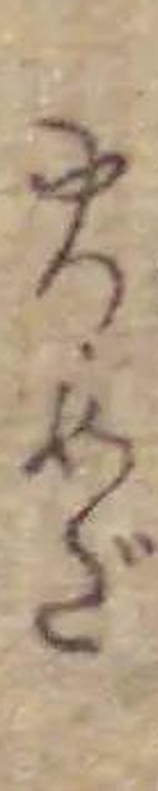やつめだ

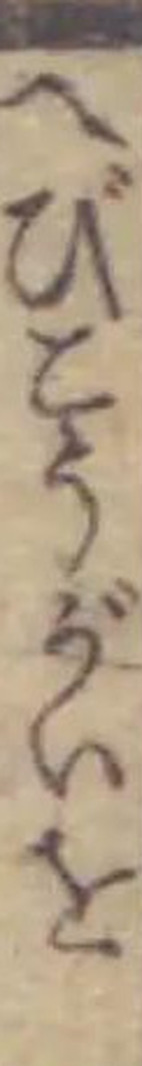へびこうがいを
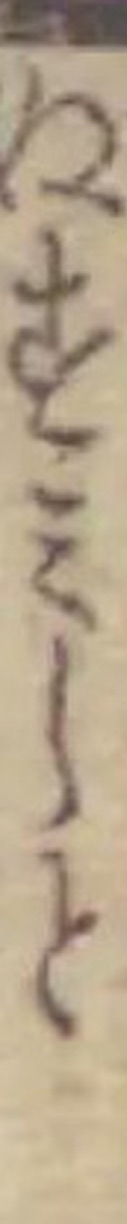ぬすみしと
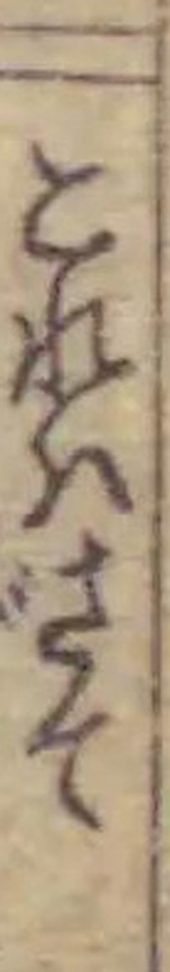これはさて
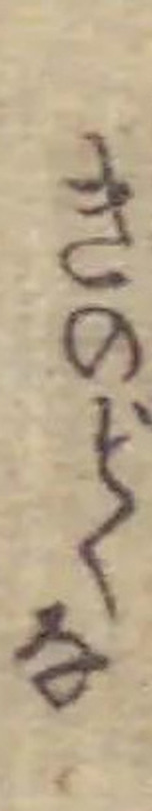きのどくな
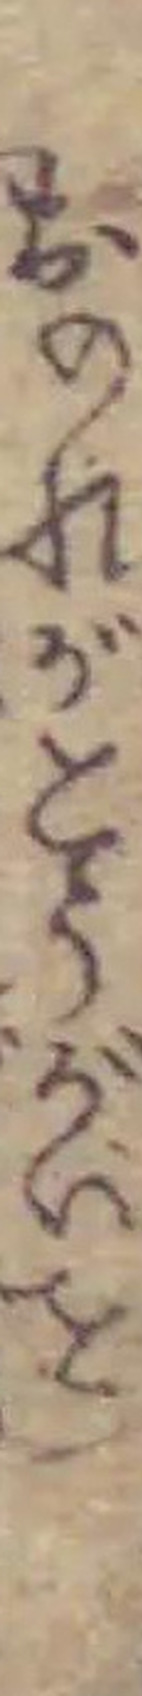おのれがこうがいを
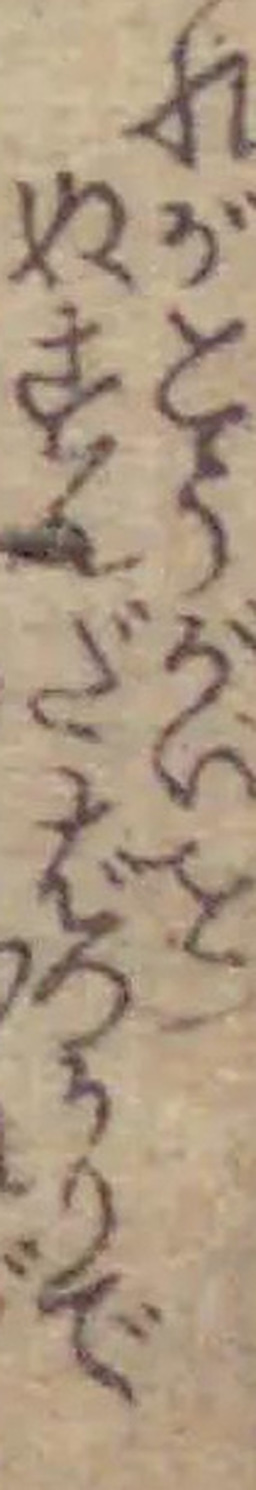ぬすんだばつかりで
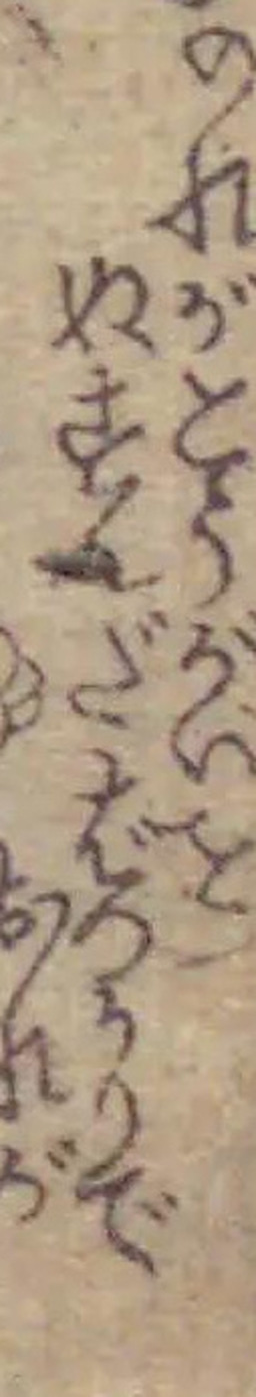ぬすんだばつかりで
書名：化物太平記 3巻
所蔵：国立国会図書館 National Diet Library, JAPAN
